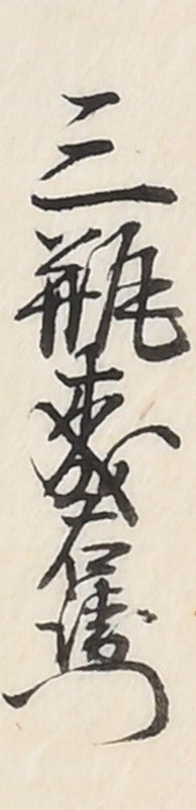三瓶森右衛門
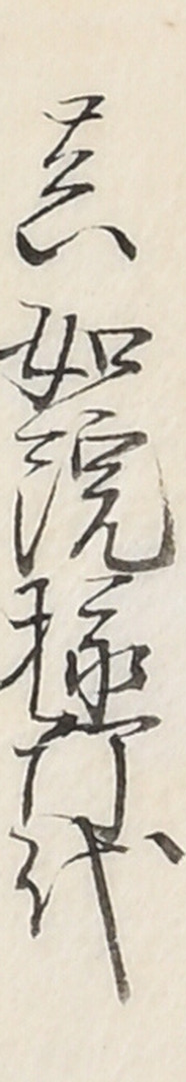真如院様御代
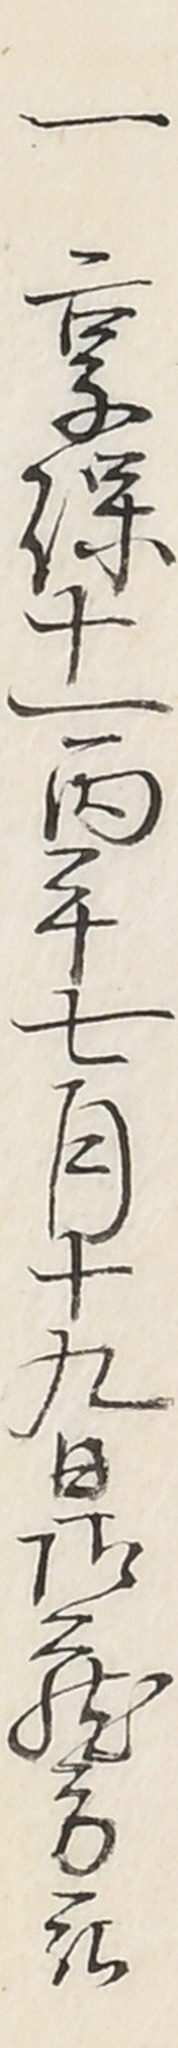一享保十一丙午七月十九日御蔵方被
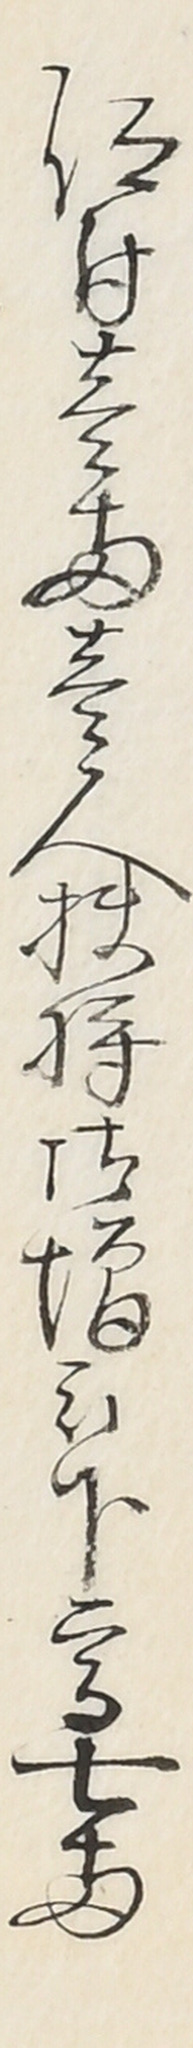仰付壱両壱人扶持御増被下高七両
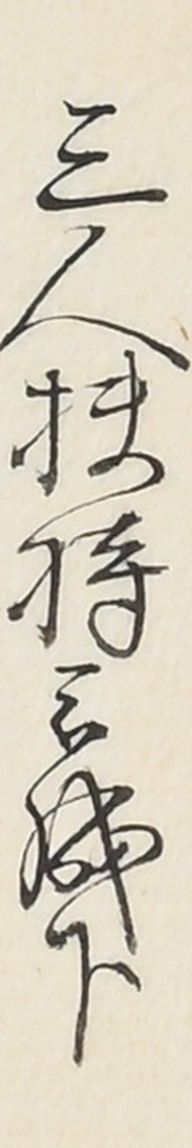三人扶持被成下
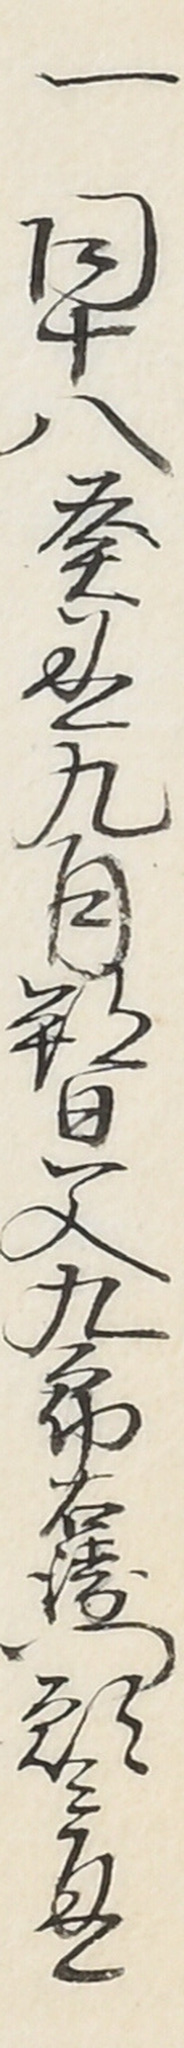一同十八癸丑九月朔日父九郎右衛門願之通
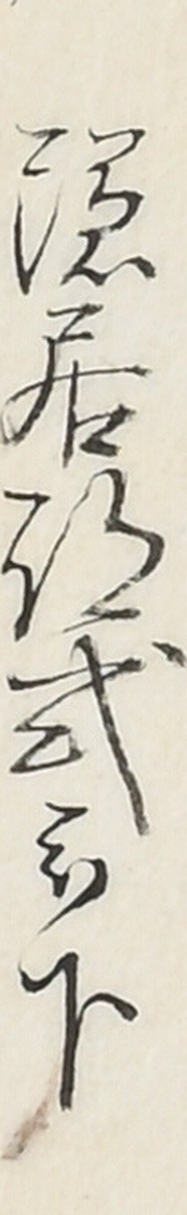隠居跡式被下
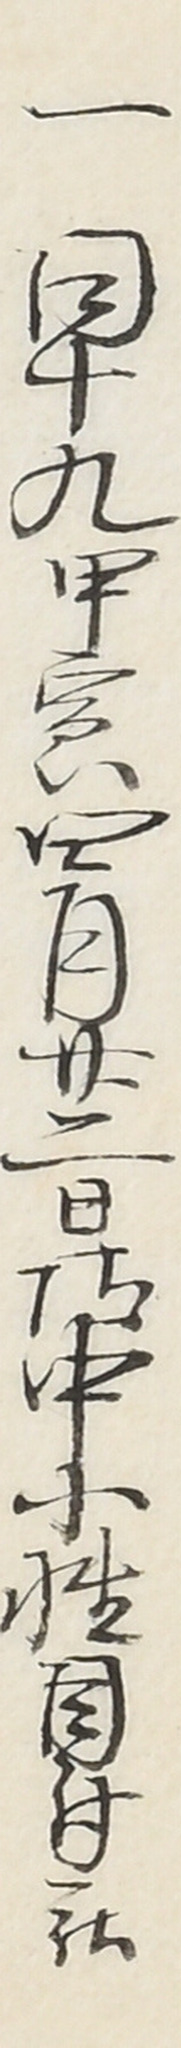一同十九甲寅四月廿二日御中小性目付被
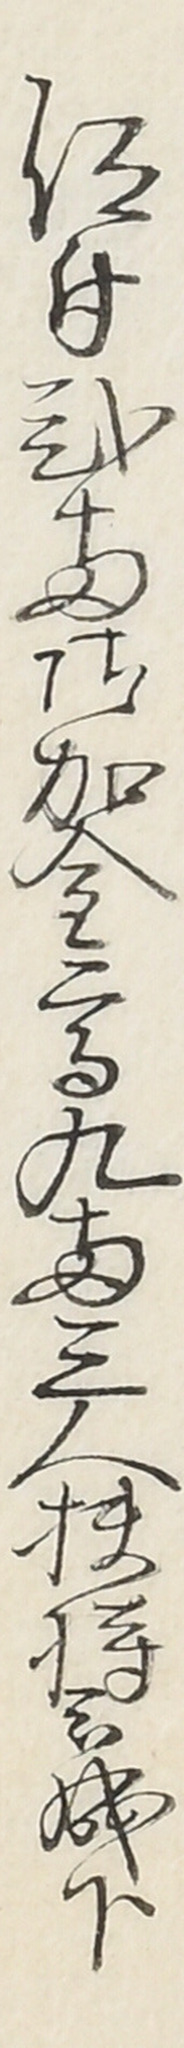仰付弐両御加金高九両三人扶持被成下
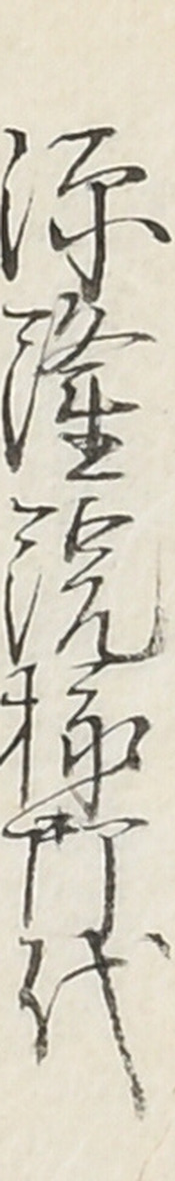源隆院様御代
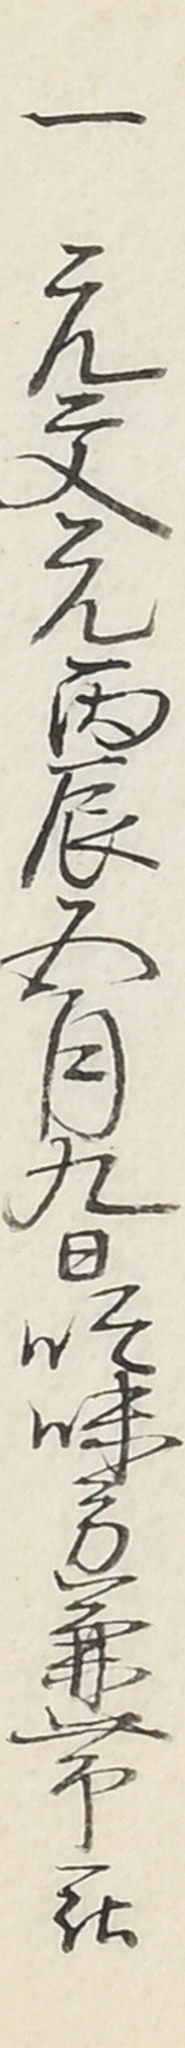一元文元丙辰五月九日吟味方兼帯被
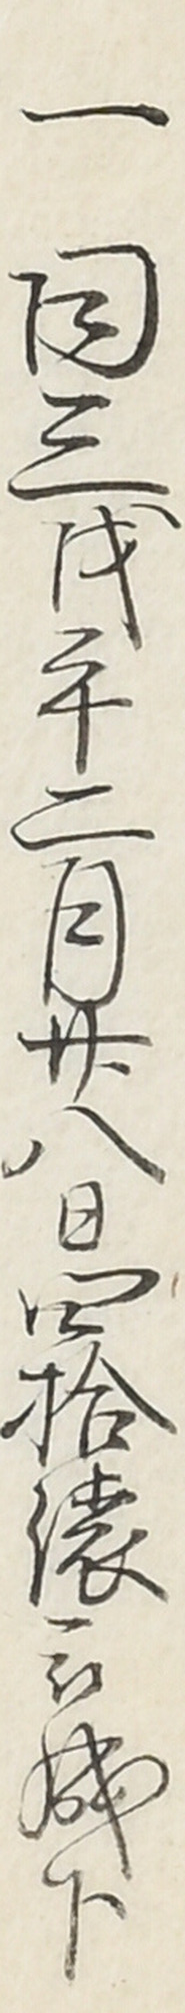一同三戊午二月廿八日四拾俵被成下
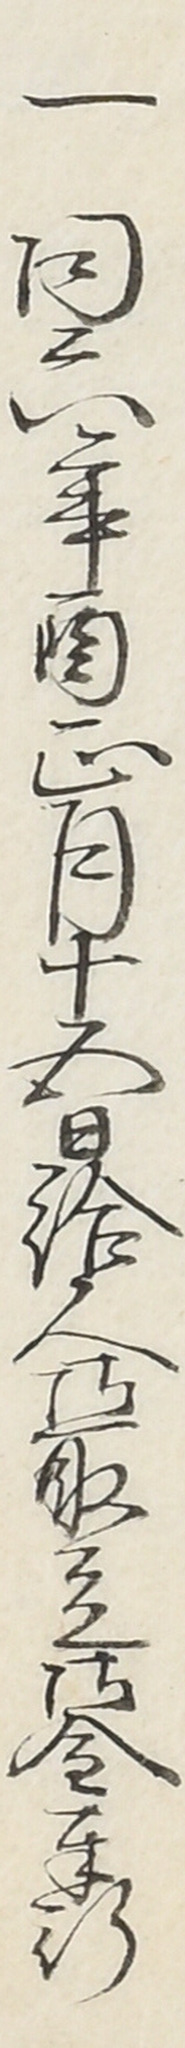一同六辛酉正月十五日給人御取立御金奉行
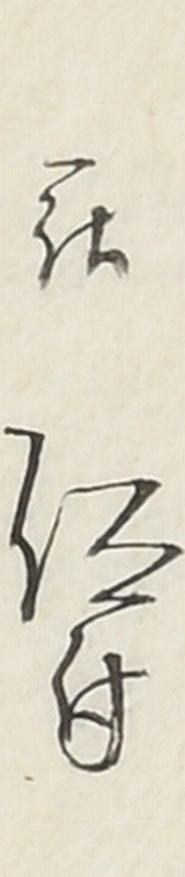被仰付
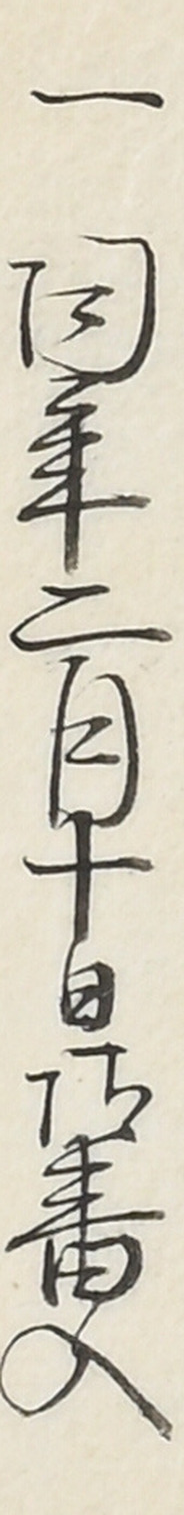一同年二月十日御番入
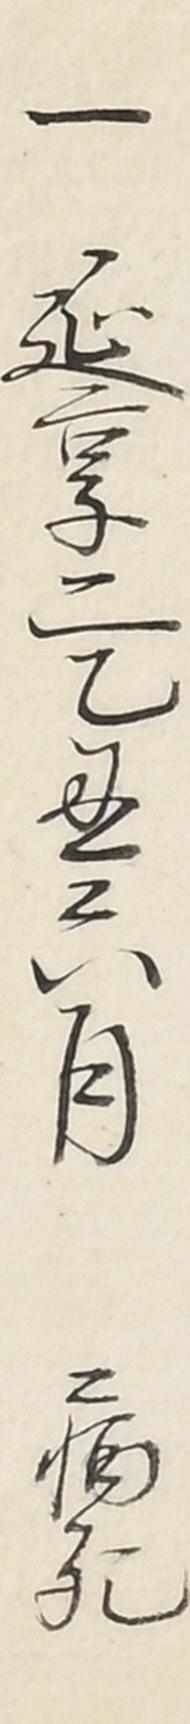一延享二乙丑六月病死
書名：給人諸士勤仕録（七）
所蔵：伊那市立高遠町図書館・合同会社AMANE
